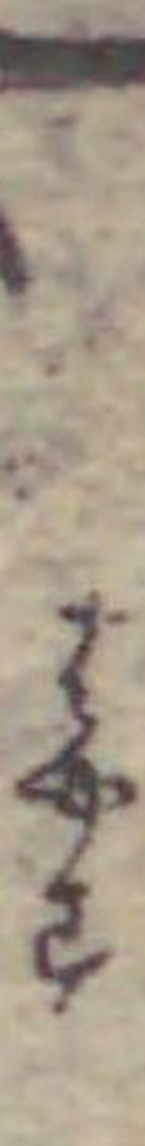はやす
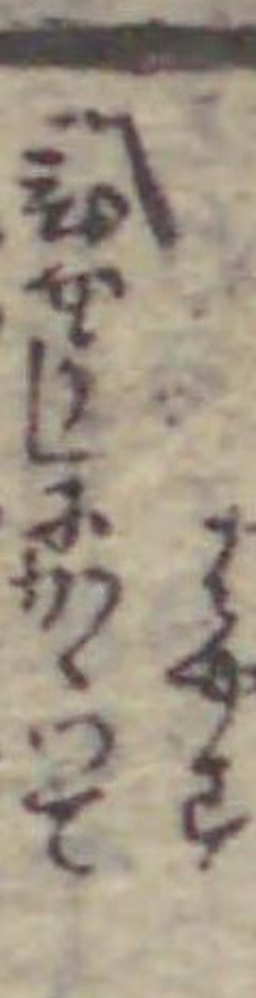〽ひやうしにかゝつて
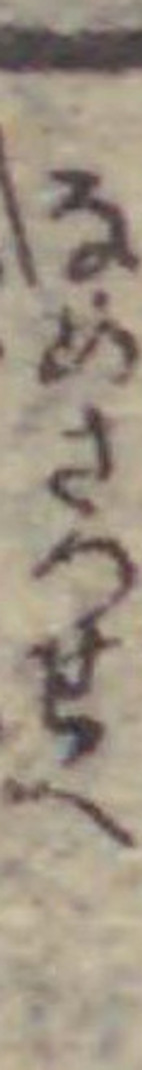なめさつせへ
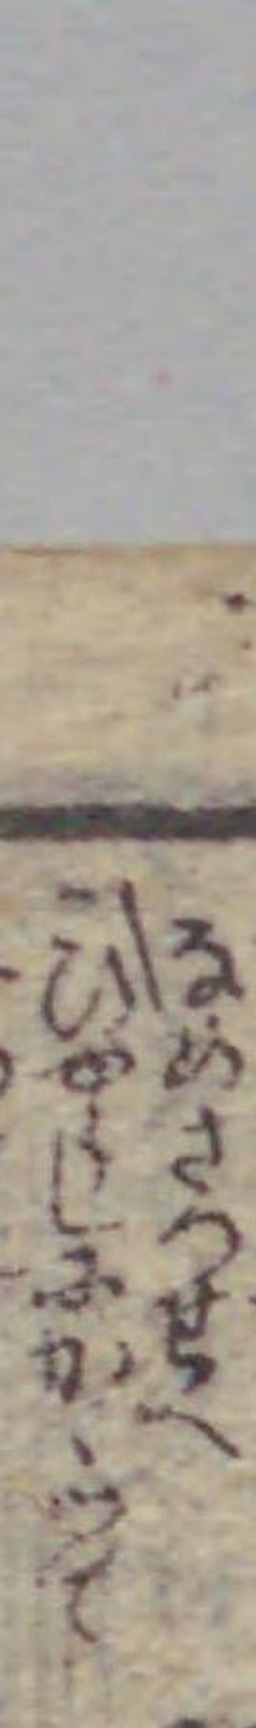〽ひやうしにかゝつて
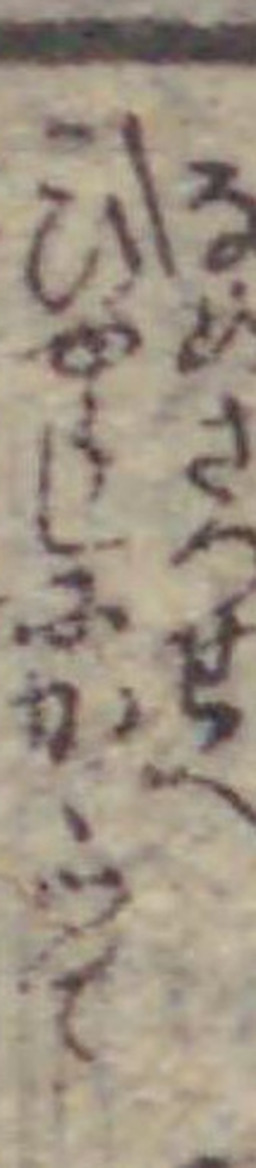〽ひやうしにかゝつて
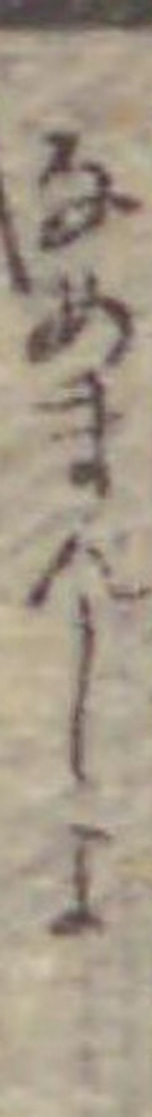なめまんしよ
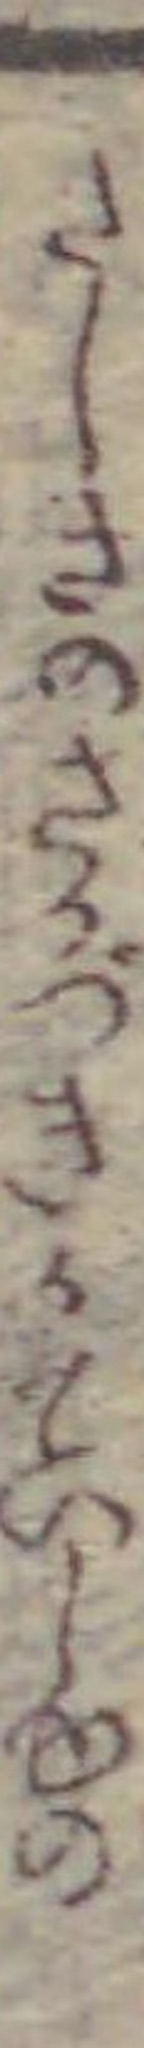さしきのさかづきかていしゆの
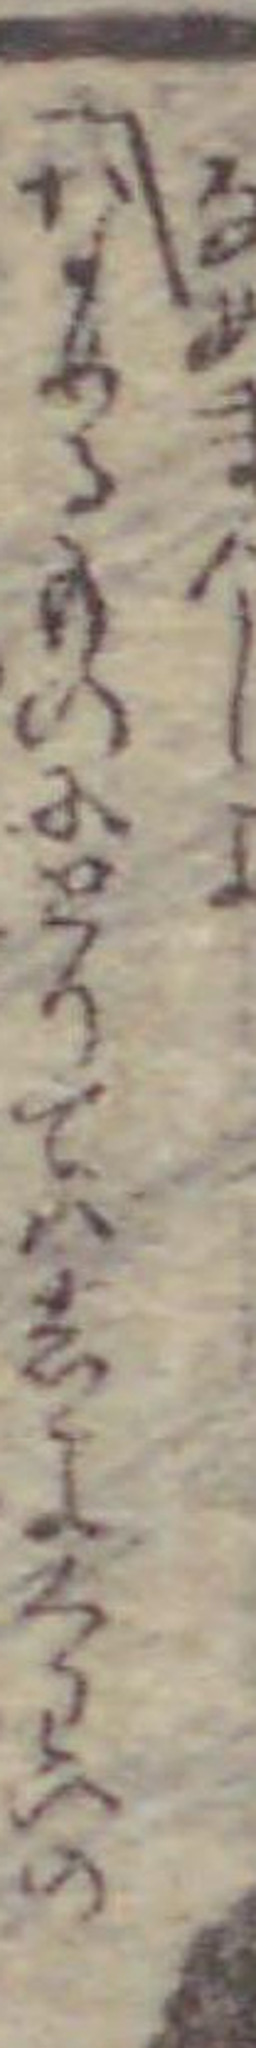〽なめるものにとりてはしよくわいの
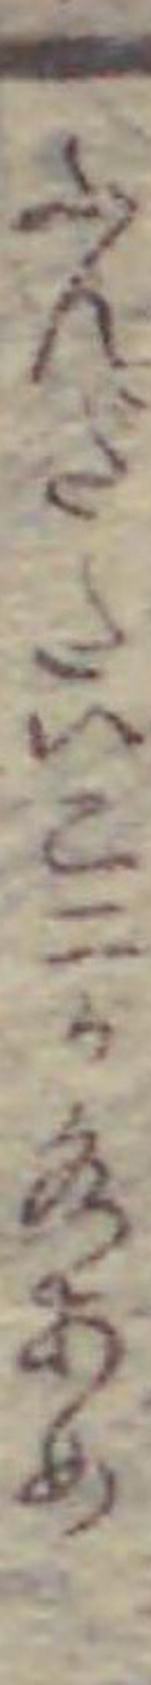ふんだたいこ二か水あめ
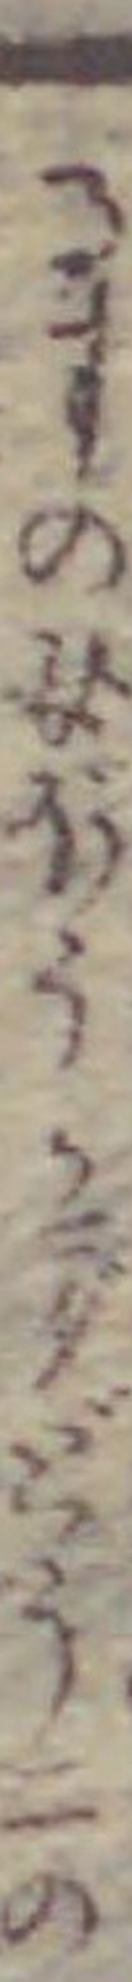るすの女ぼうかマダどう二の
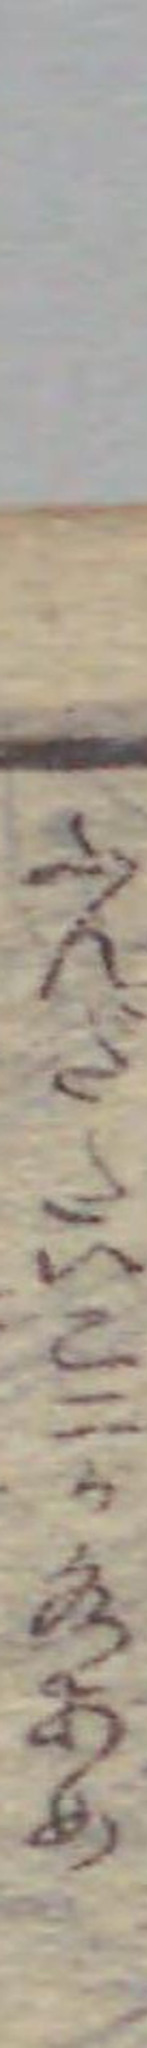ふんだたいこ二か水あめ
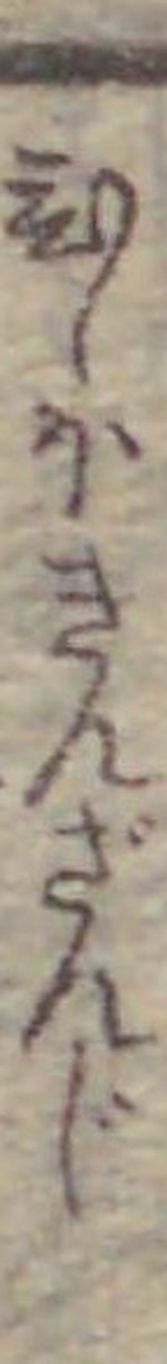ひしほきんざんじ
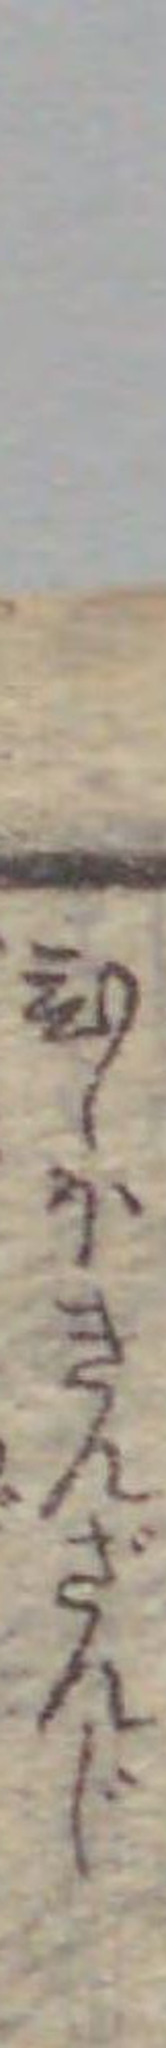ひしほきんざんじ
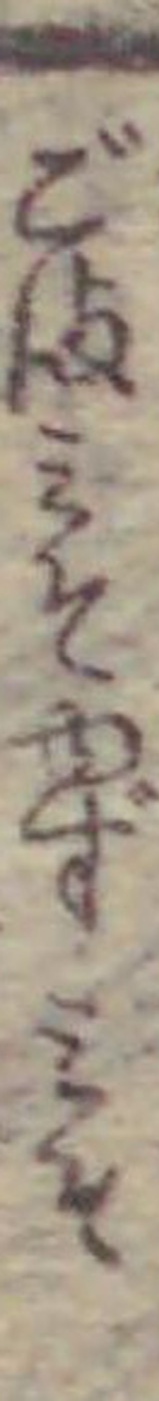ごまみそゆずみそ
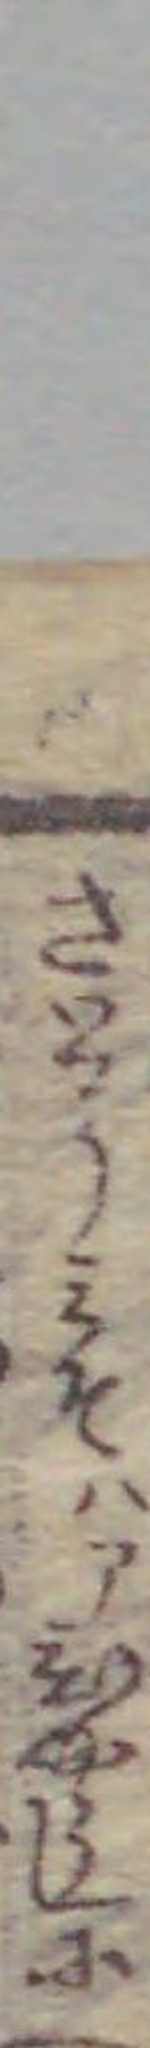さとうみそハアひょあうしに
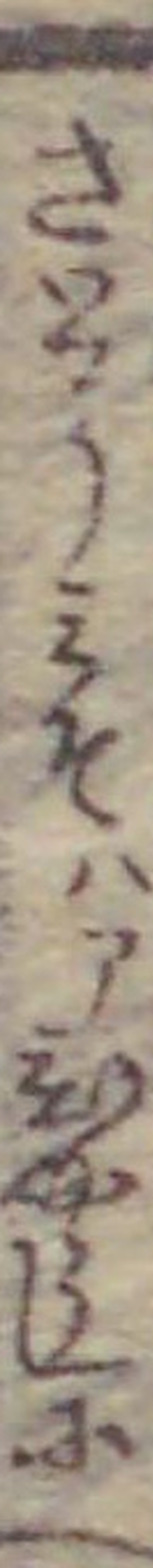さとうみそハアひょあうしに
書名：箱入娘面屋人魚 3巻
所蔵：国立国会図書館 National Diet Library, JAPAN
